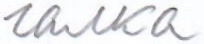галка
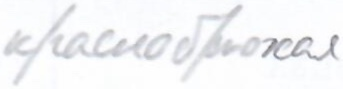краснобрюхая
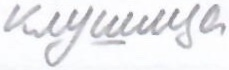клушица
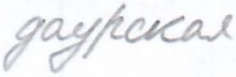даурская
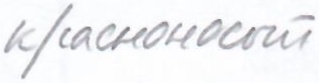красноносый
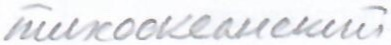тихоокеанский
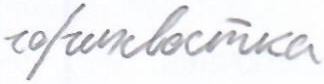горихвостка
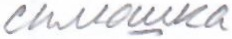сплюшка
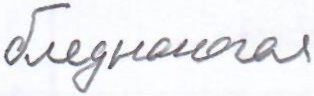бледноногая
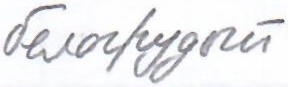белогрудый
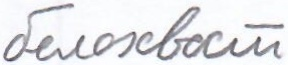белохвост
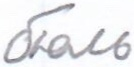бюль
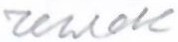чеглок
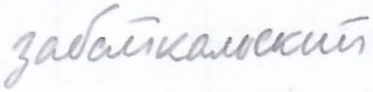забайкальский
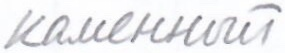каменный
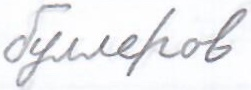буллеров
